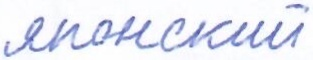японский
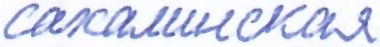сахалинская
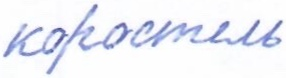коростель
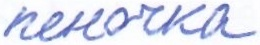пеночка
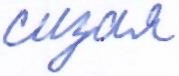сизая
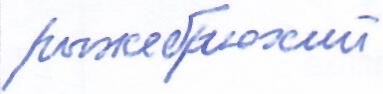рыжебрюхий
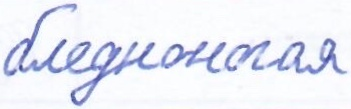бледноногая
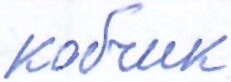кобчик
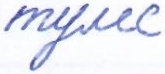тулес
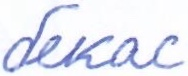бекас
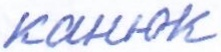канюк
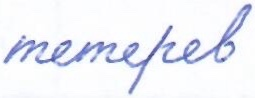тетерев
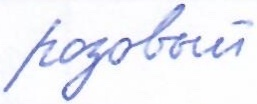розовый
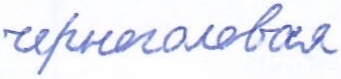черноголовая
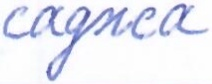саджа
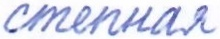степная
